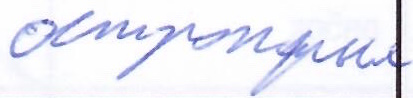острокрыл
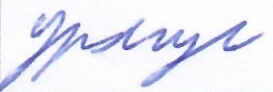урагус
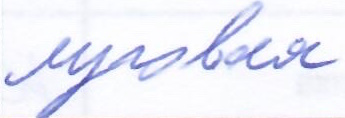луговая
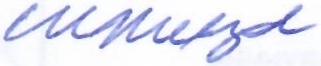синица
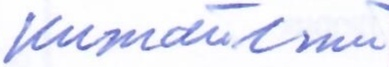китайский
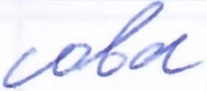сова
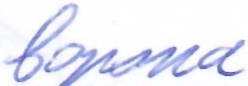ворона
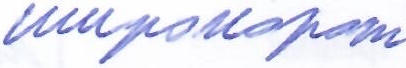широкорот
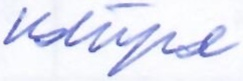кайра
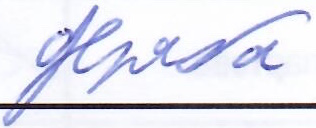деряба
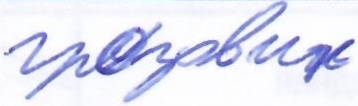грозовик
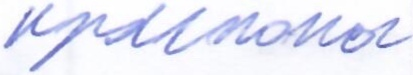красноног
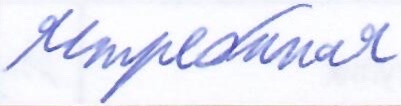ястребиная
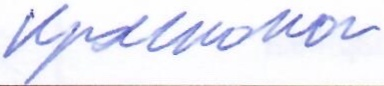красноног
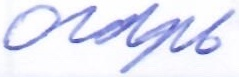огарь
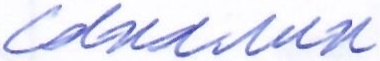сахалин
